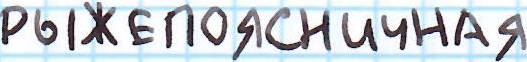рыжепоясничная
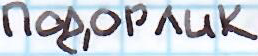подорлик
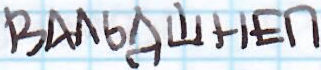вальдшнеп
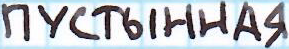пустынная
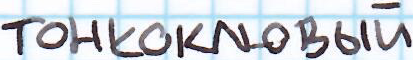тонкоклювый
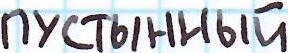пустынный
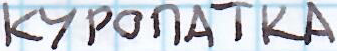куропатка
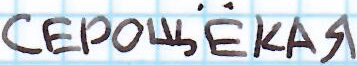серощёкая
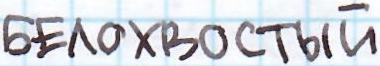белохвостый
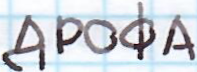дрофа
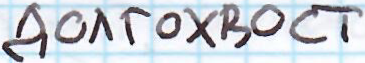долгохвост
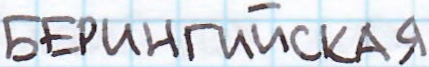берингийская
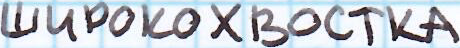широкохвостка
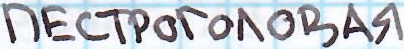пестроголовая
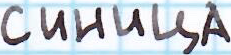синица
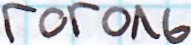гоголь
